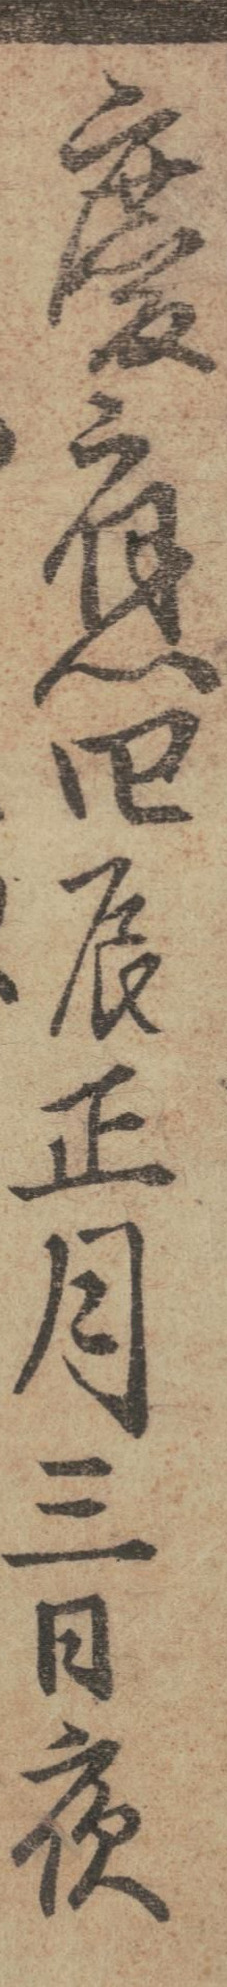慶應四辰正月三日夜
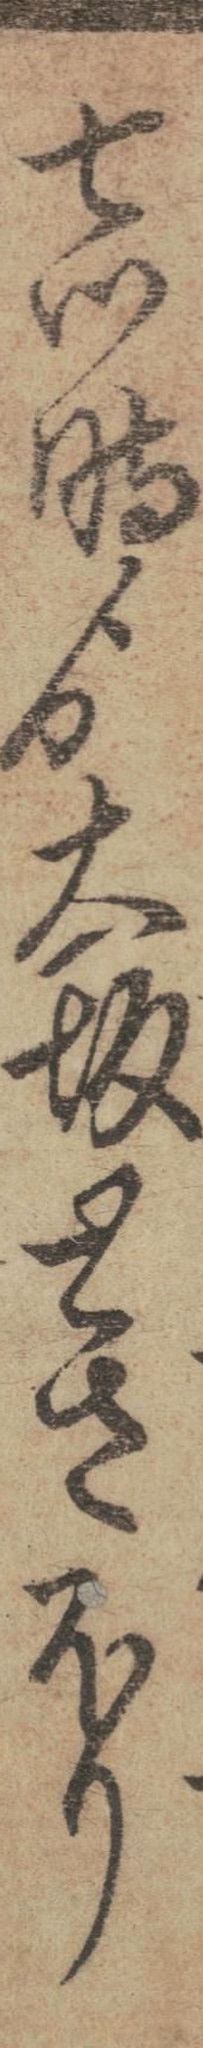七ツ時ゟ大坂とさほり
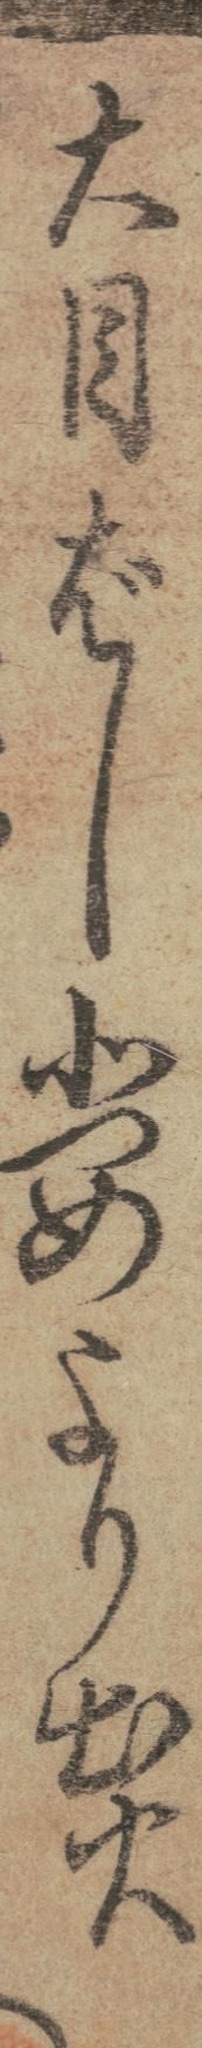大目ばし北つめより出火
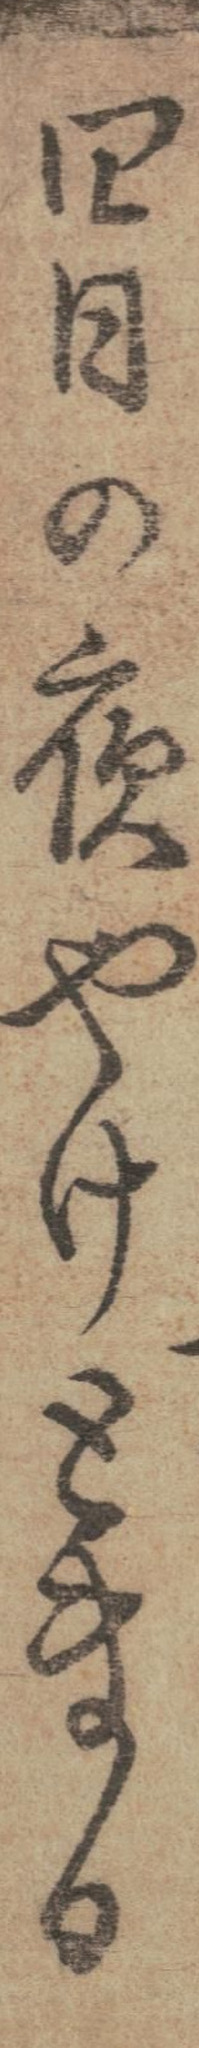四日の夜やけとまる
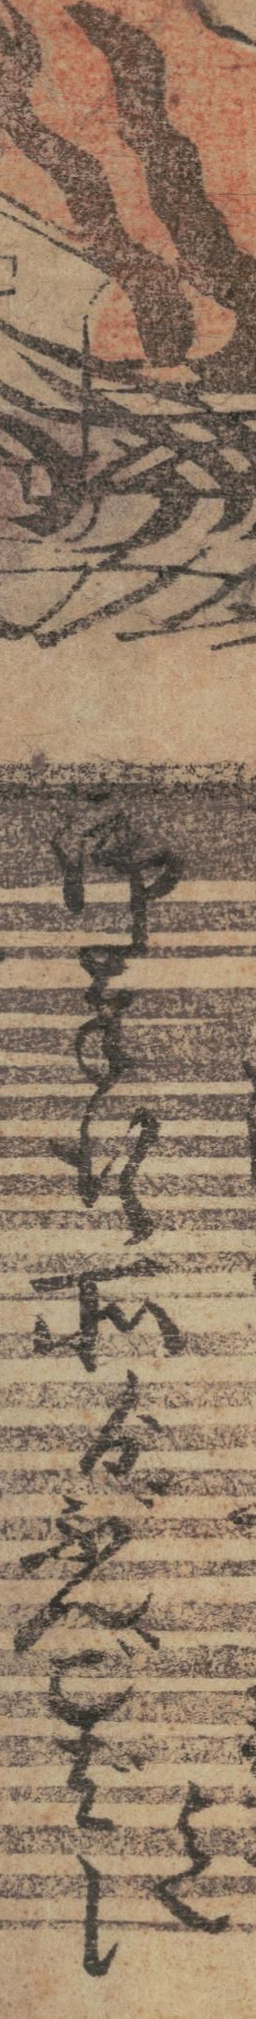御奉行所ゟぶんごばし西
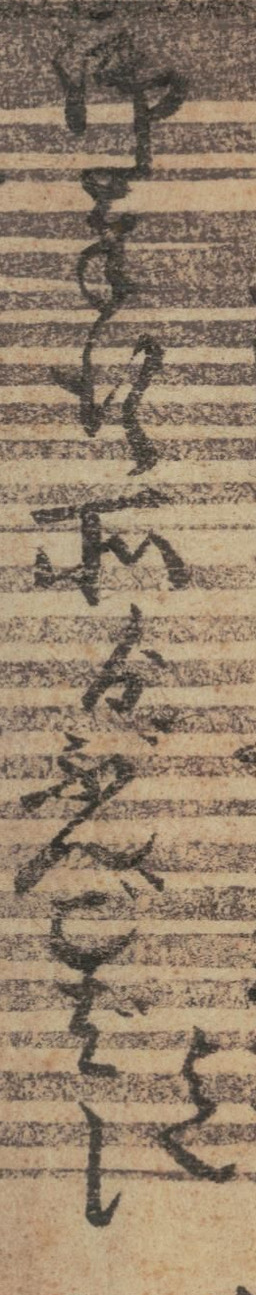御奉行所ゟぶんごばし西
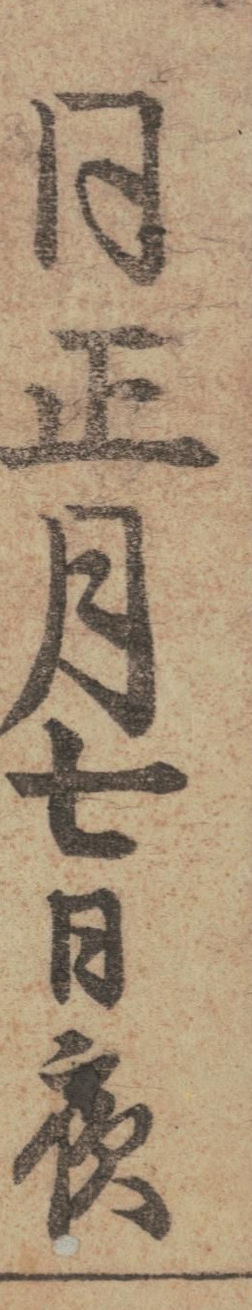同正月七日夜
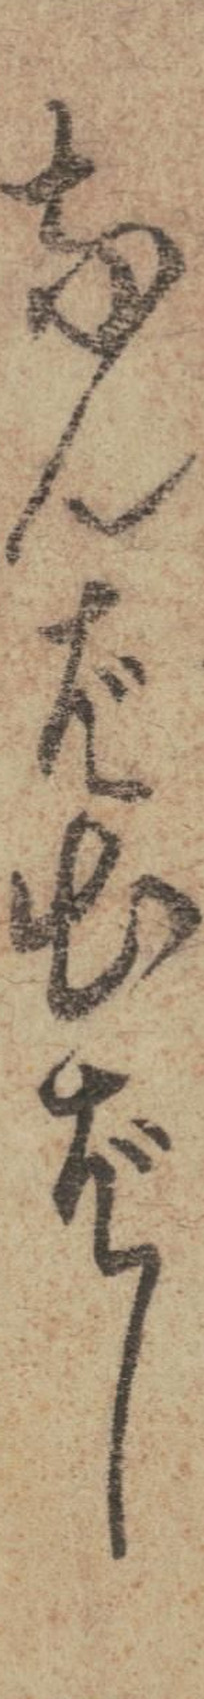なんば出ばし
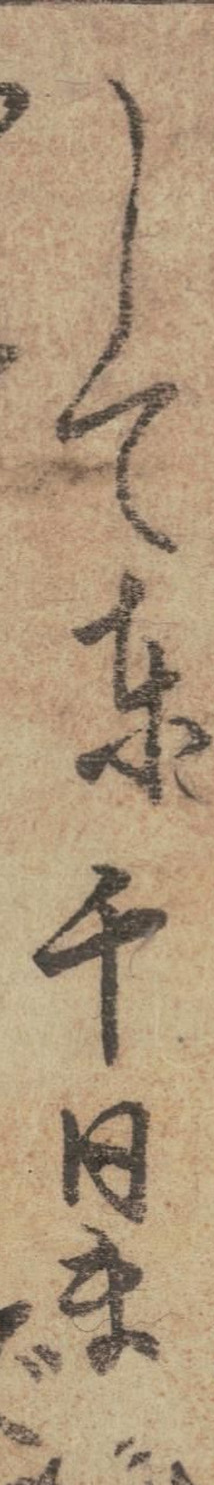して東千日まで
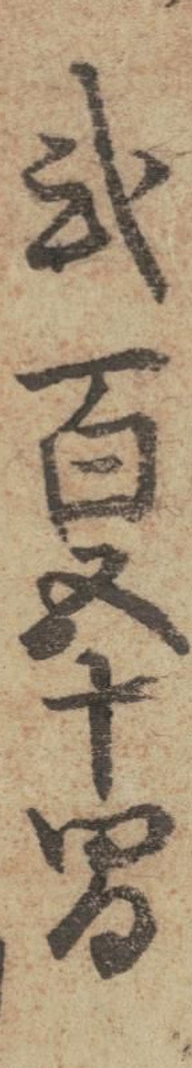弐珀五十間
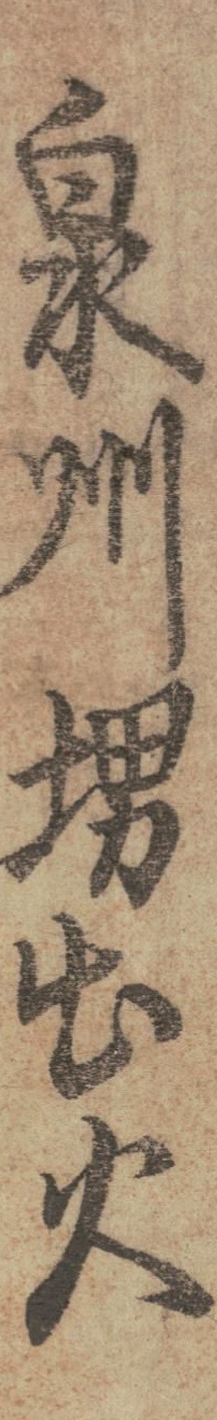泉州堺出火
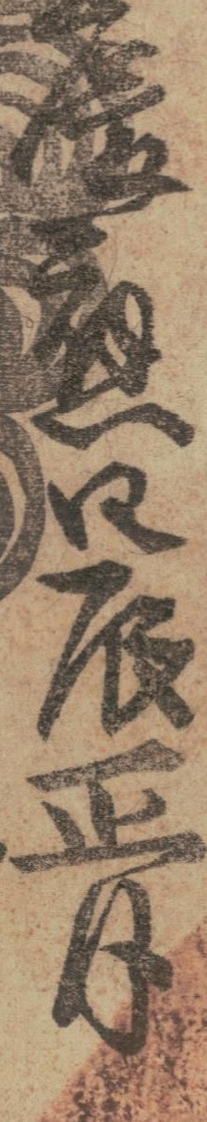慶應四辰正月
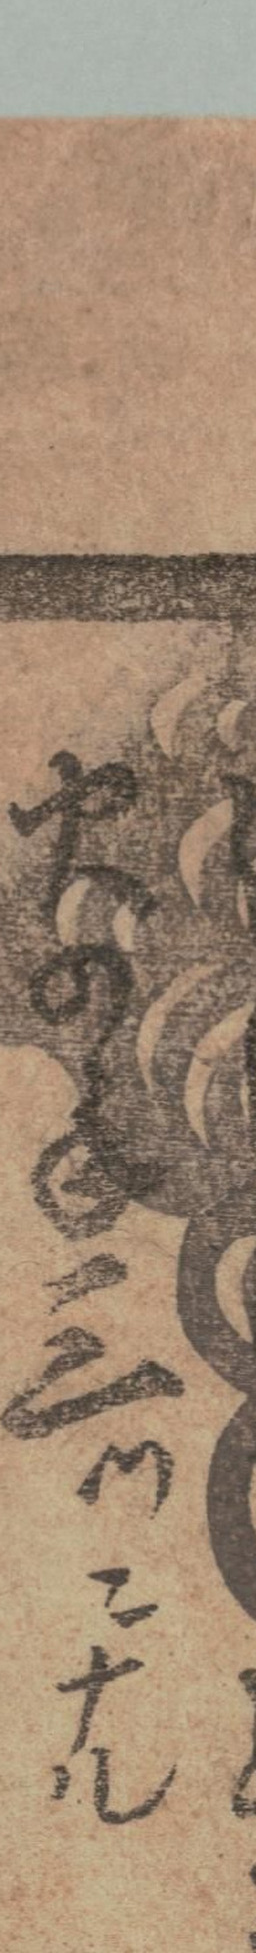火の手三つになる
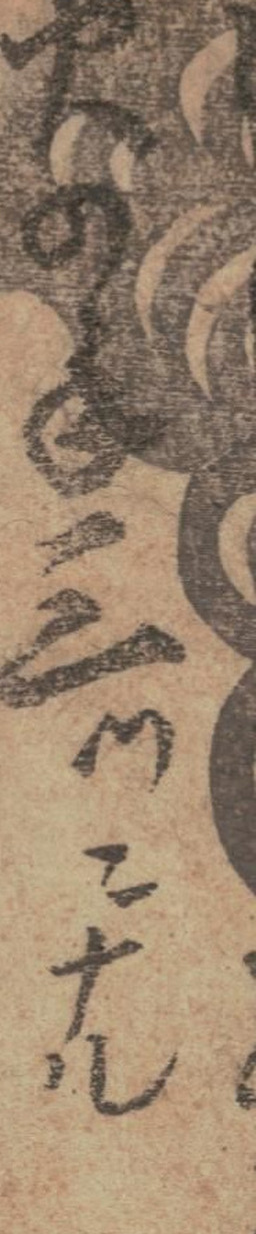火の手三つになる
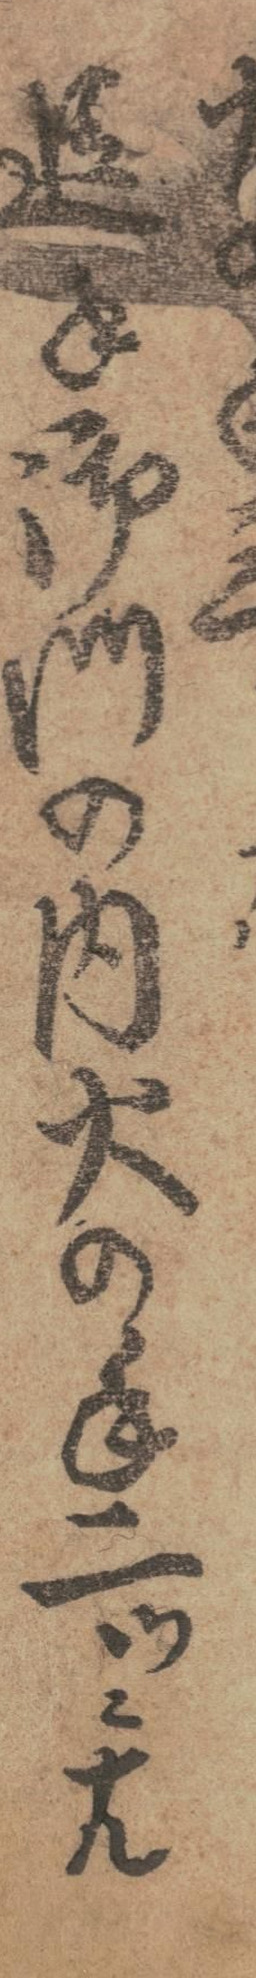追手御門の内火の手二ツになる
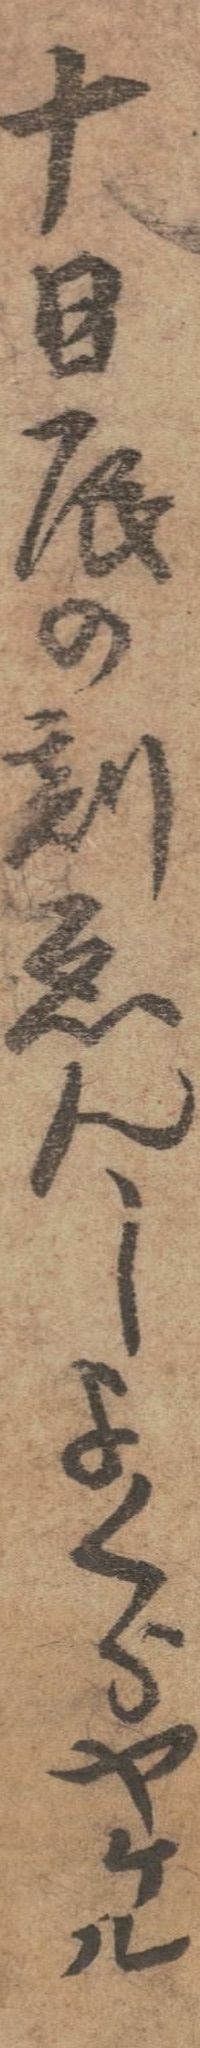十日辰の刻えんしよくらやける
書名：淀川大坂堺大火細見　本しらべ
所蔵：東京大学地震研究所図書室 Earthquake Research Institute Library, The University of Tokyo, JAPAN
